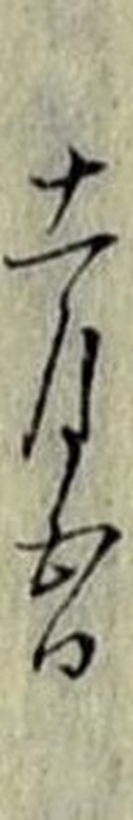十一月五日
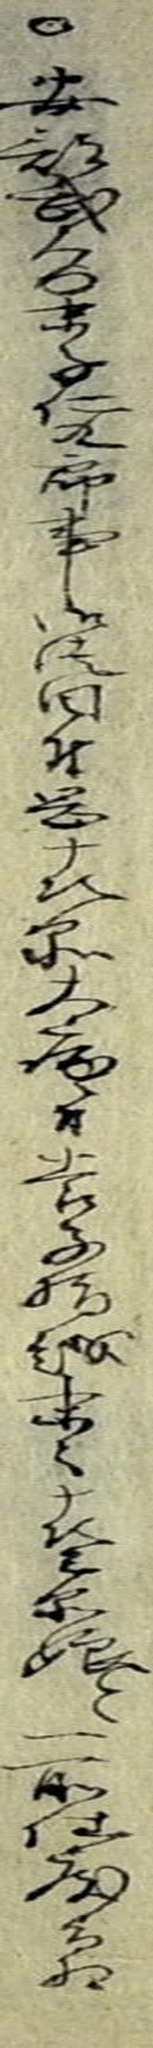〇安部武右衛門末子仁九郎事御徒目付岡十次兵衛大病ニ付養子指越末々十次兵衛娘と一所仕度旨相
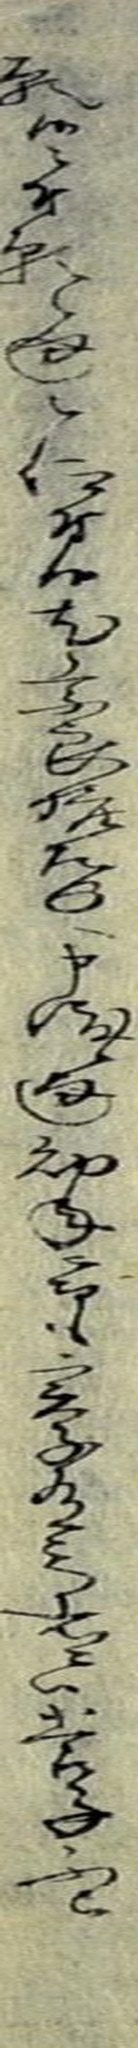願候ニ付願之通被仰付候尤奈良権左衛門へ申渡候通幼年ニ而も実子有之者ニハ養子不被
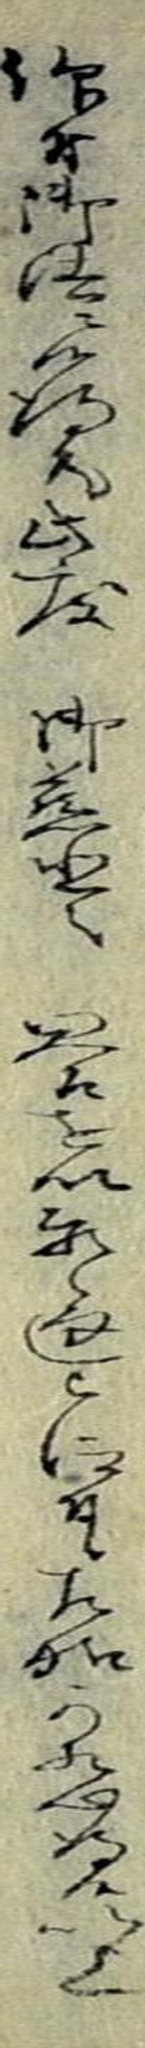仰付御法ニ候得共此度御慈悲之思召を以願之通被仰付候左様可相心得候以上
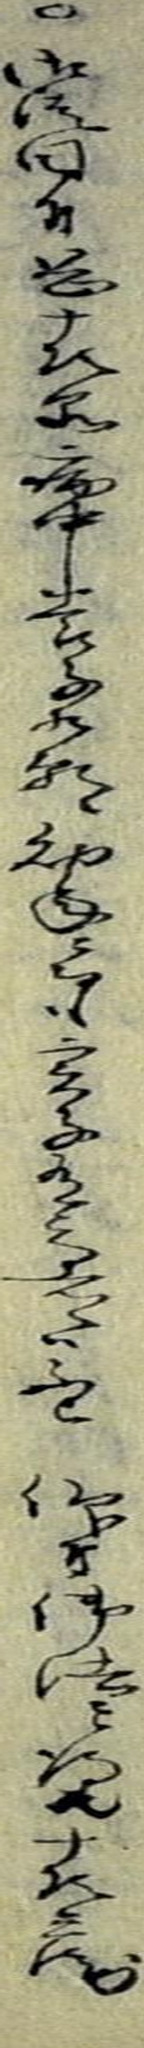〇御徒目付岡十次兵衛病中養子相願候幼年ニ而も実子有之者へハ不被仰付御法ニ候得共十次兵衛
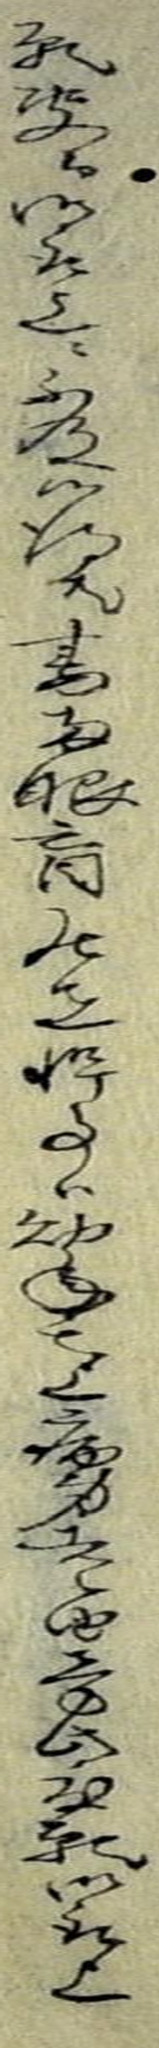願決而御取上ニ不及候得共妻両眼盲罷在忰事ハ幼年其上病身者之由旁此度願御取上
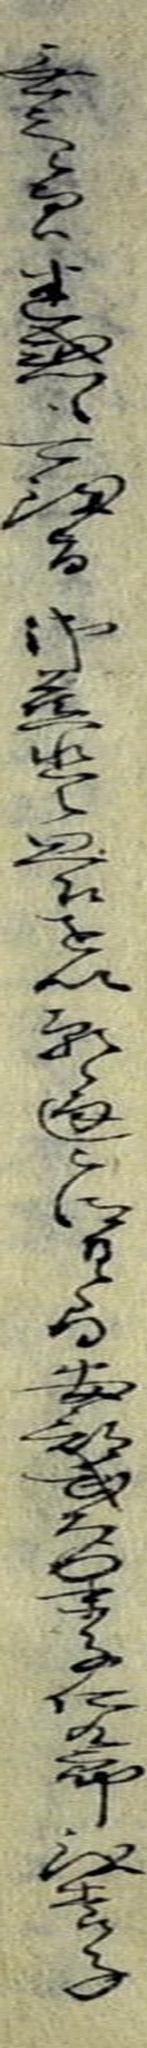無之候而ハ迷惑も可致旨御慈悲之思召を以願之通被仰付候間安部武右衛門末子仁九郎致養子
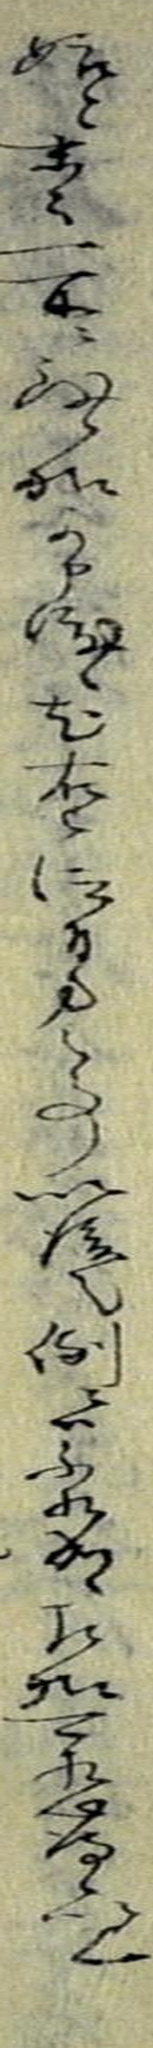娘と末々一所ニ致候様可申渡候尤右被仰付方之事以後之例ニハ不相成候左様可相心得候以上
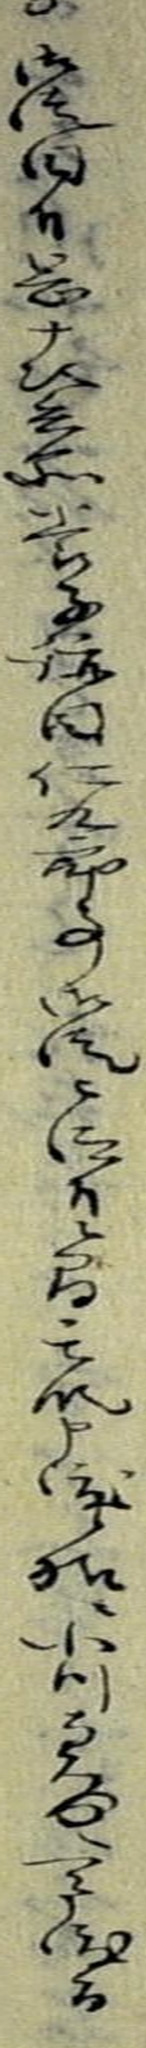〇御徒目付岡十次兵衛養子跡目仁九郎事御徒被仰付候間其段申渡候様ニ小川与右衛門へ可被申渡旨
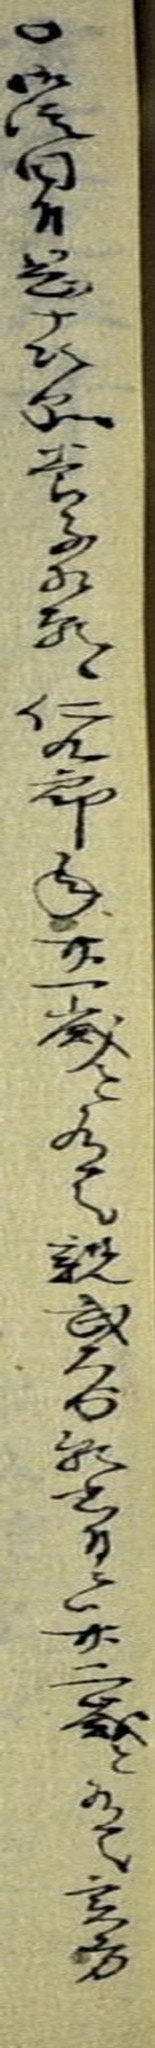〇御徒目付岡十次兵衛養子相願候仁九郎年廿一歳と有之親武右衛門願書付ニハ廿二歳と有之実方
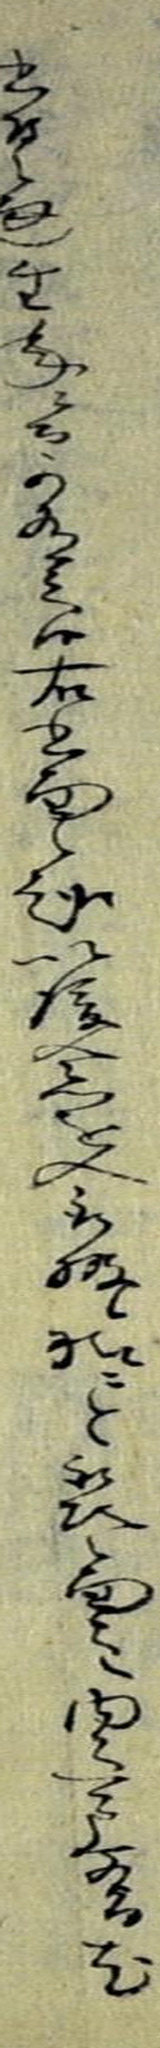書付之通生年ニ而可有之候右書面之趣以後念を入取扱候様ニと取次之面々へ内々可申聞旨尤
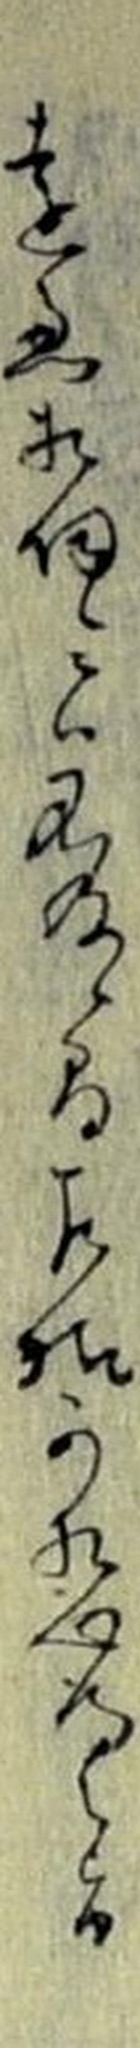遠慮相伺候ニハ不及候間左様可相心得之旨
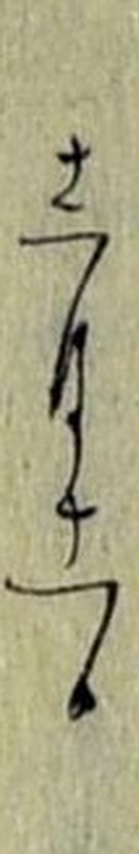十二月十一日
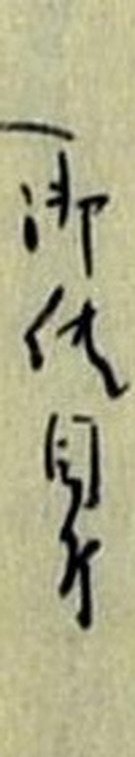御供目付
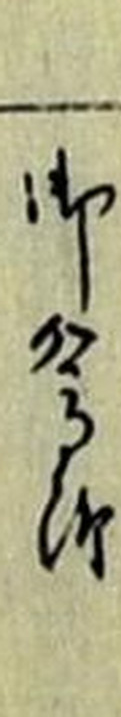御駕付
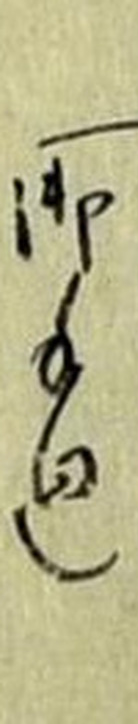御手廻
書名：命令之部 一
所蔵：福井県文書館 Fukui Prefectural Archives
